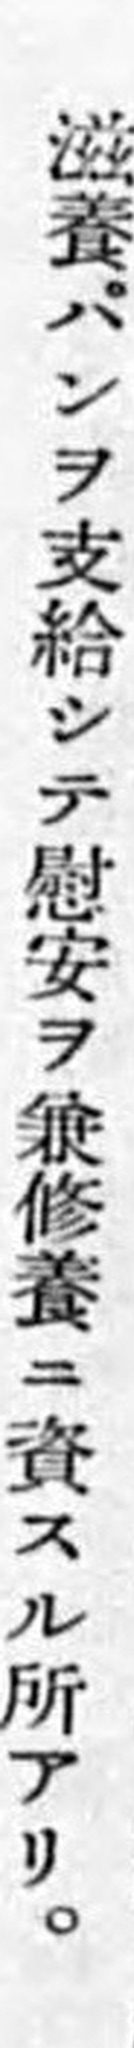滋養パンヲ支給シテ慰安ヲ兼修養ニ資スル所アリ。
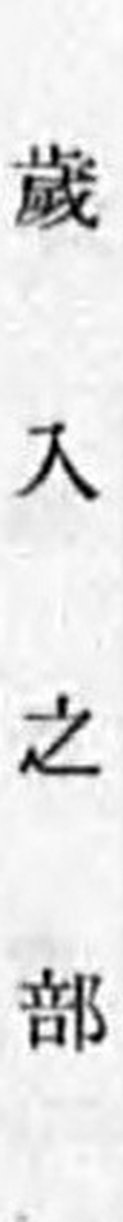歳入之部
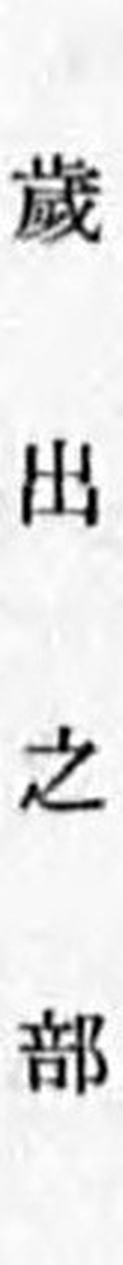歳出之部

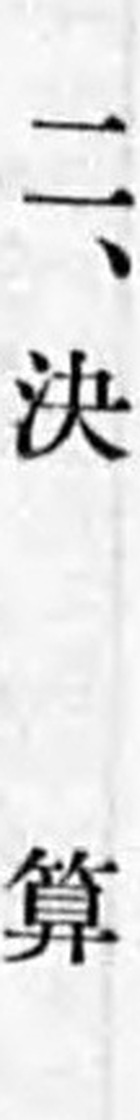二、決算
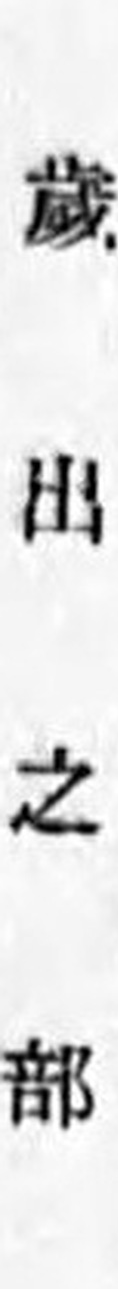歳出之部
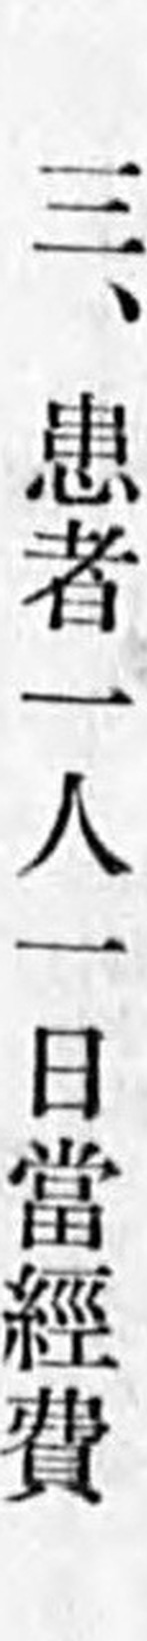三、患者一人一日当経費
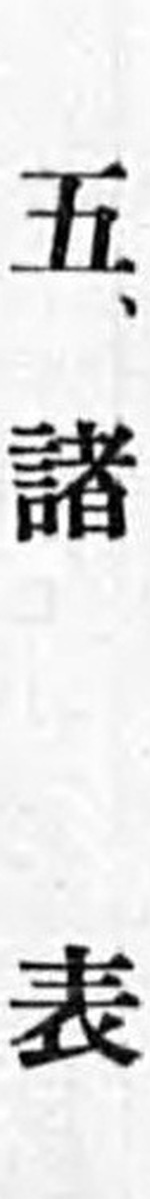五、諸表
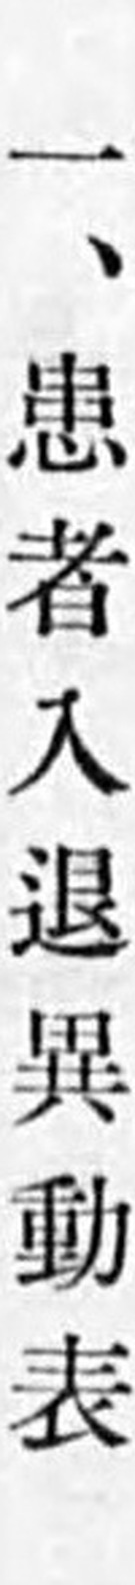一、患者入退異動表
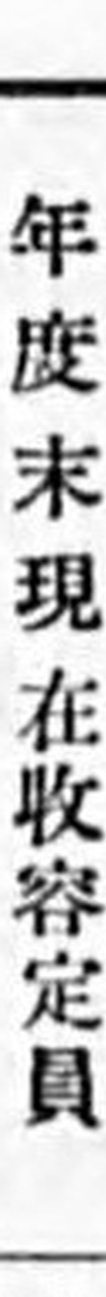年度末現在収容定員男

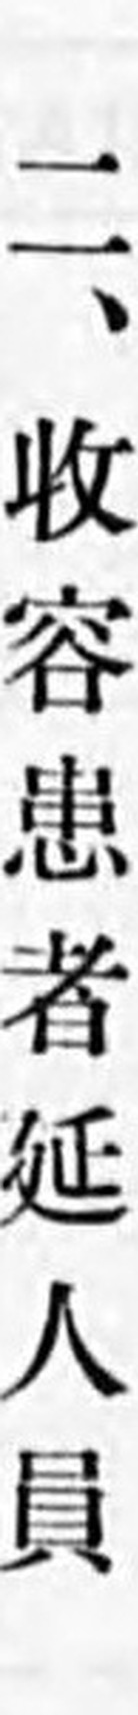二、収容患者延人員
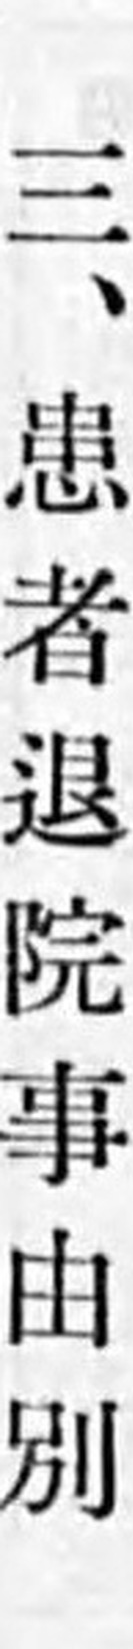三、患者退院事由別
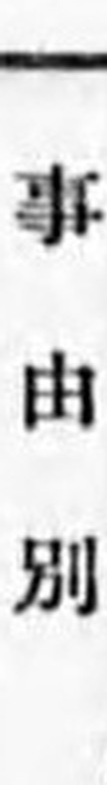事由別
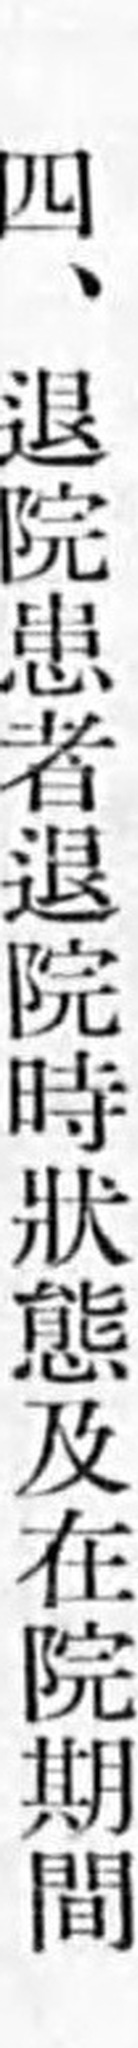四、退院患者退院時状態及在院期間

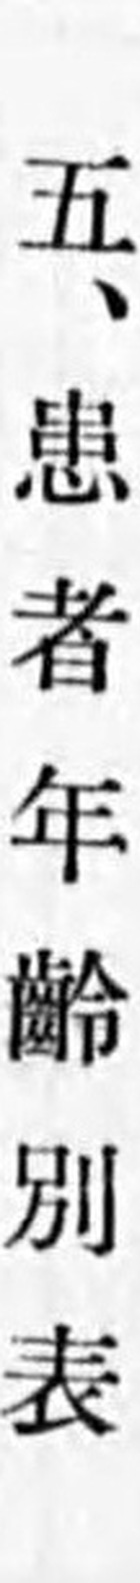五、患者年齢別表
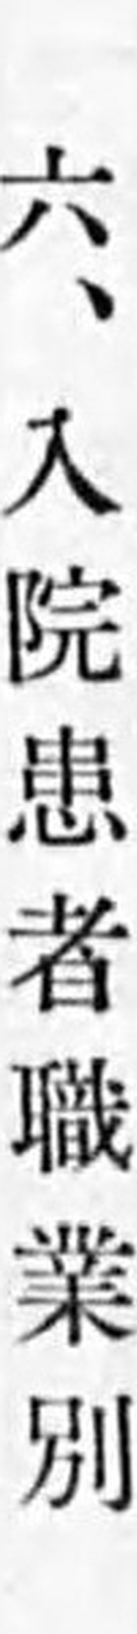六、入院患者職業別
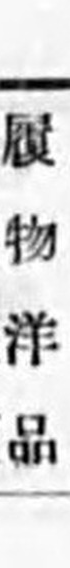履物洋品
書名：豊橋市立高山病院年報. 昭和12年度
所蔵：国立国会図書館 National Diet Library, JAPAN
